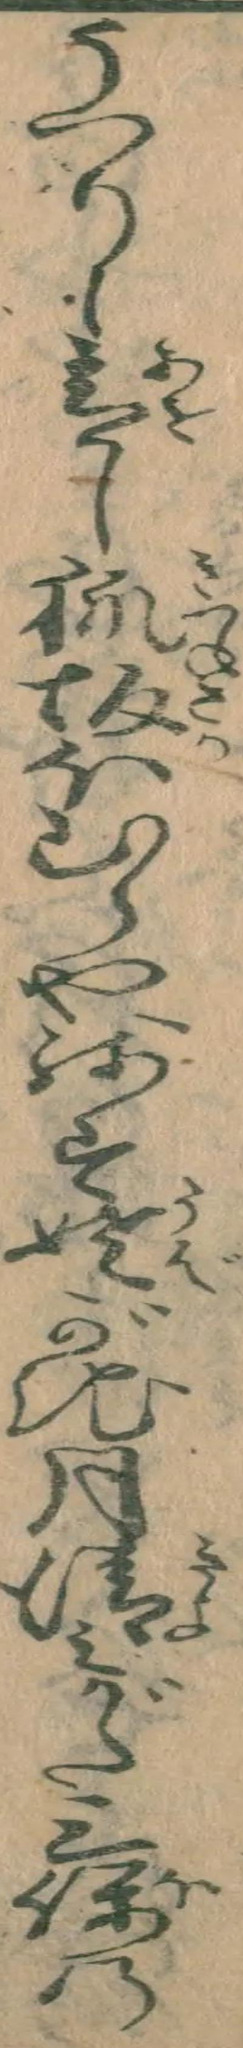うつりも青し狐坂ほむらや残す姥が池月清みがた三保の
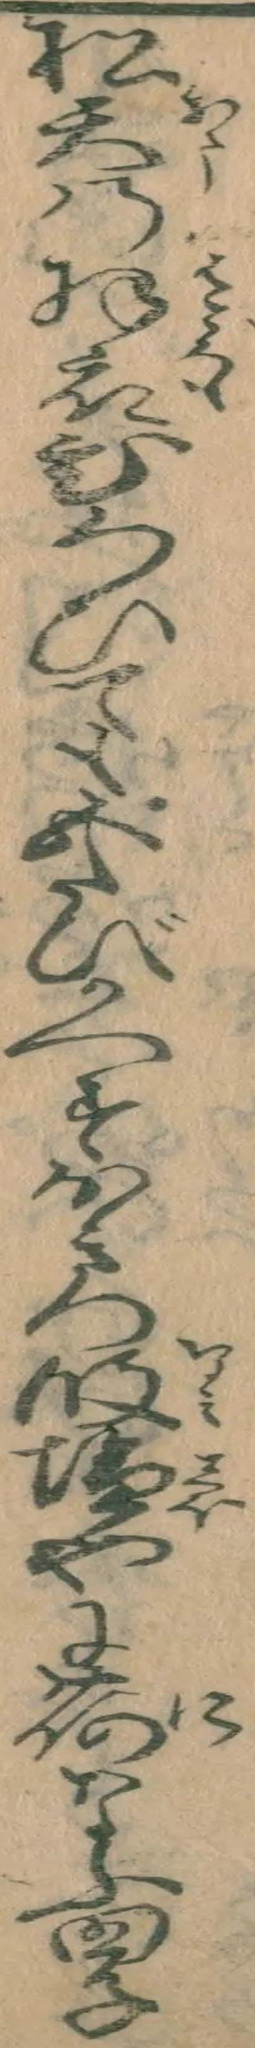松天の羽衣ひろひても五たびかへすおきつ波塩やに荷なふ田子
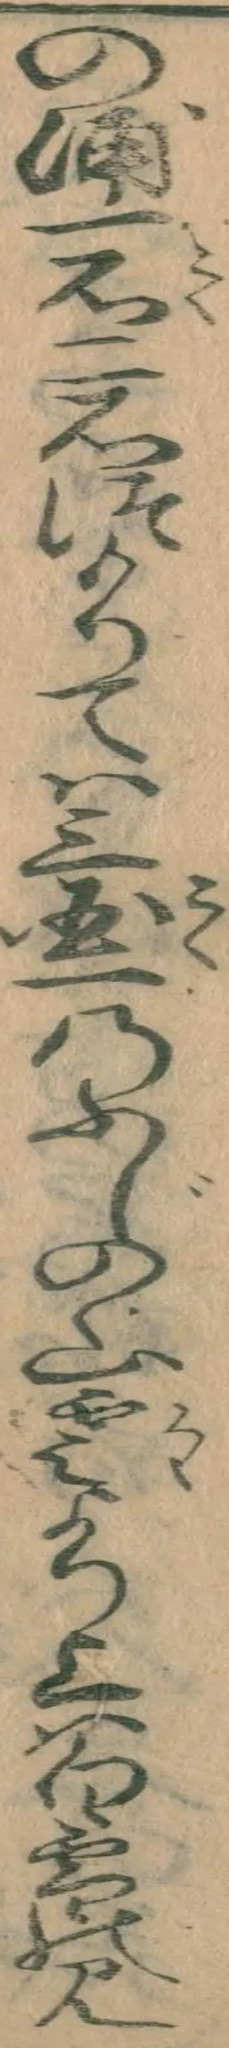の浦一石二石つもりては三国一のふじの山雲より上は白雪の見
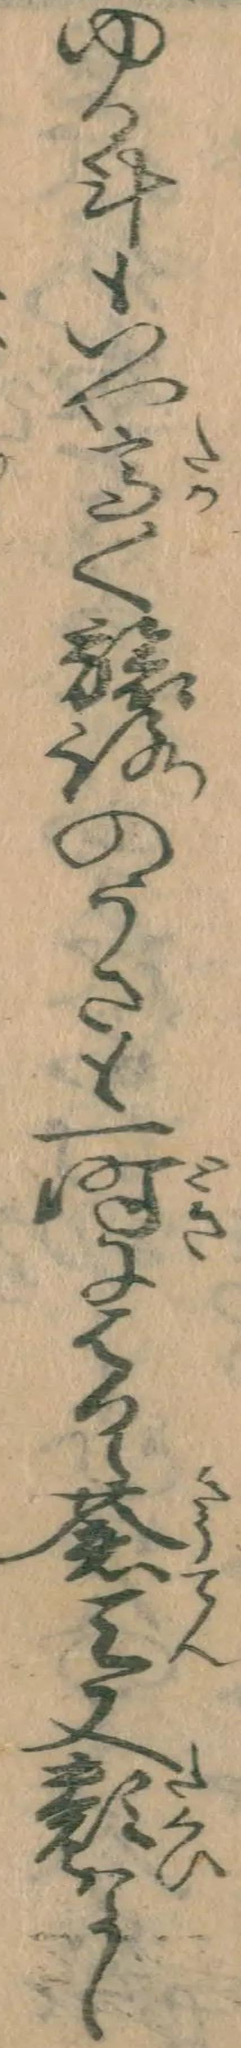ゆる計もいや高〱旅路のうさも一時にはるゝ蒼天又類なし
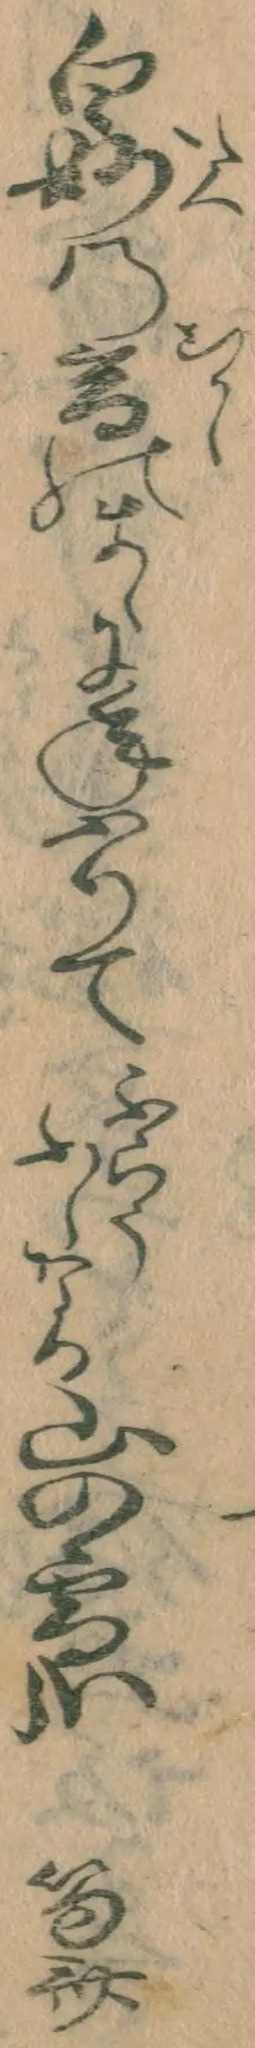白妙の昔のまゝに年ふりてふらうふしなる山の雪哉筍斎
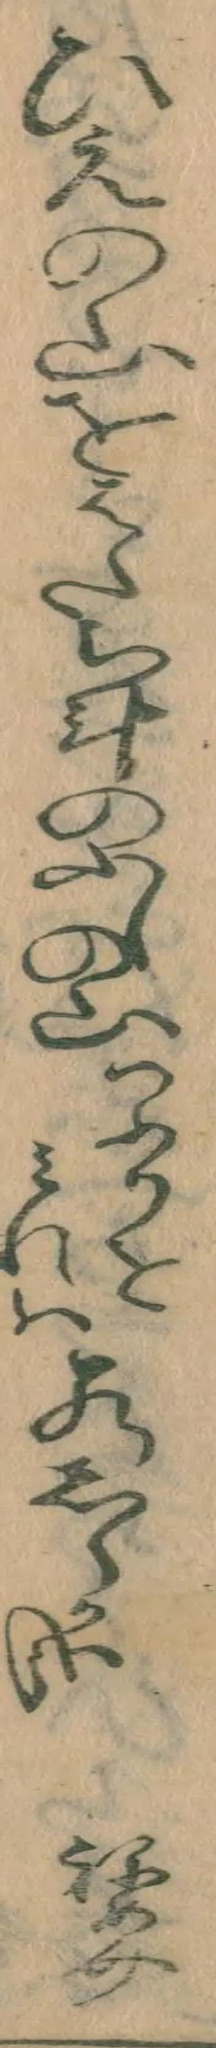ひえの山をはたち計のふしの山つふりをみれは若しらか哉ねめ介
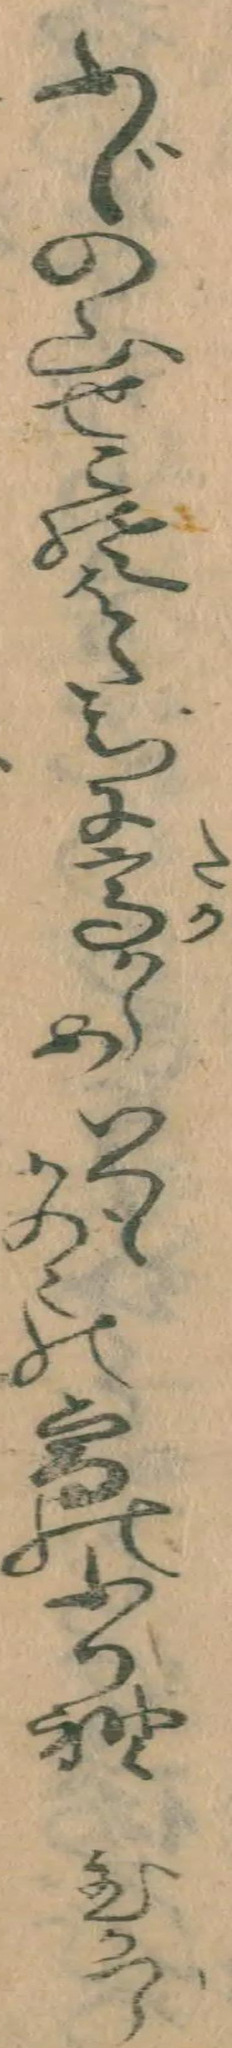ふじの山せこそはたちに高からめいくもかのこの雪のふり袖玉かつら
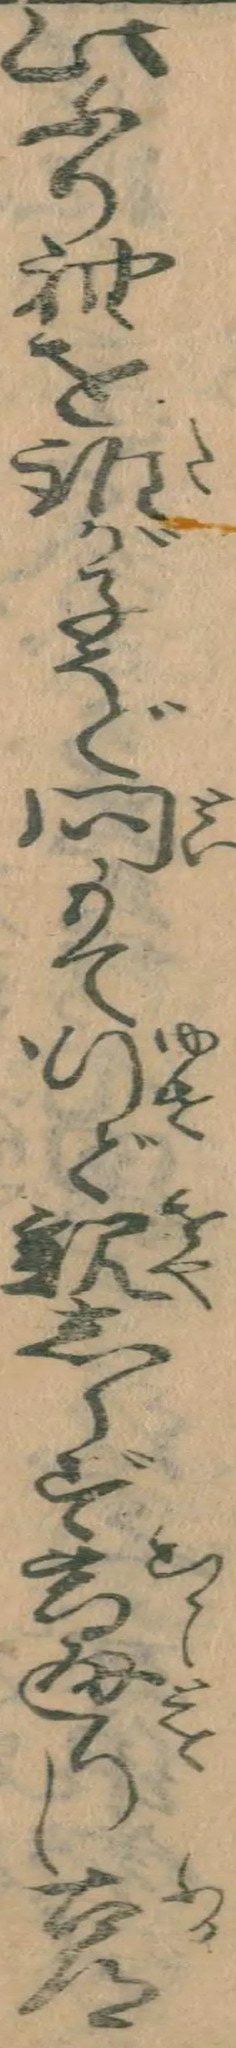此ふり袖を誰が子ぞと問もて行ど親しらず昔通りし古道
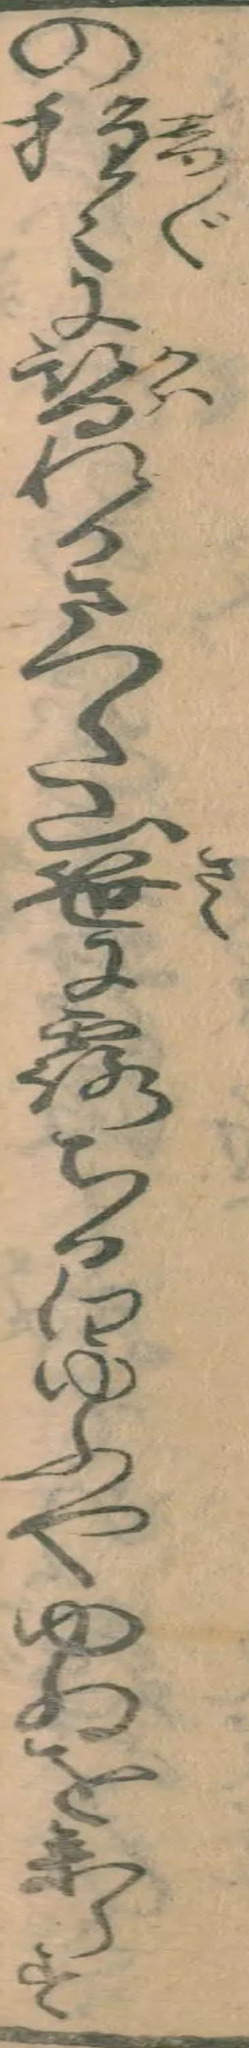の種々に替れるさつた山笹に露ちる白ゆふやゆゐを参らす
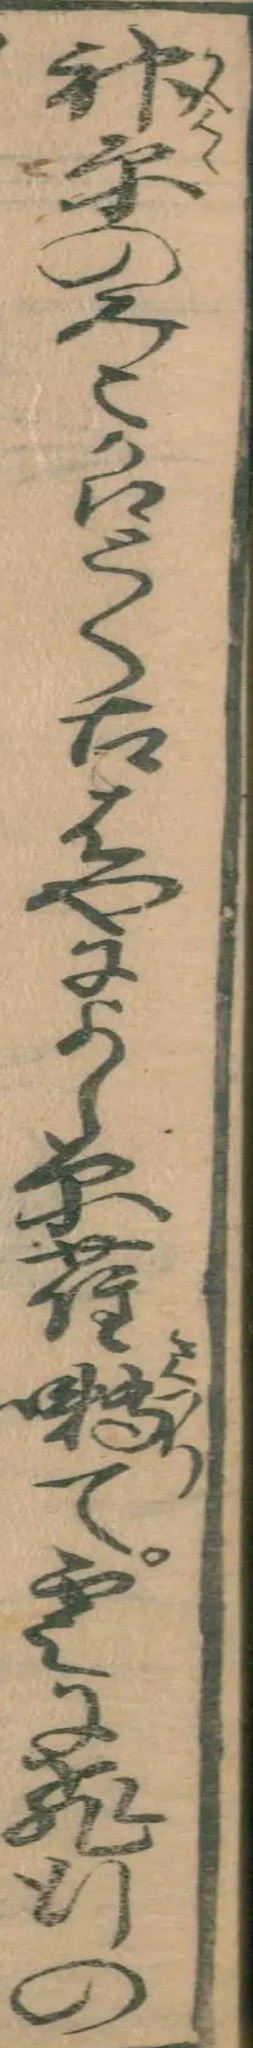神原のみこか口とく古はやによし原雀囀て。雲に飛行の
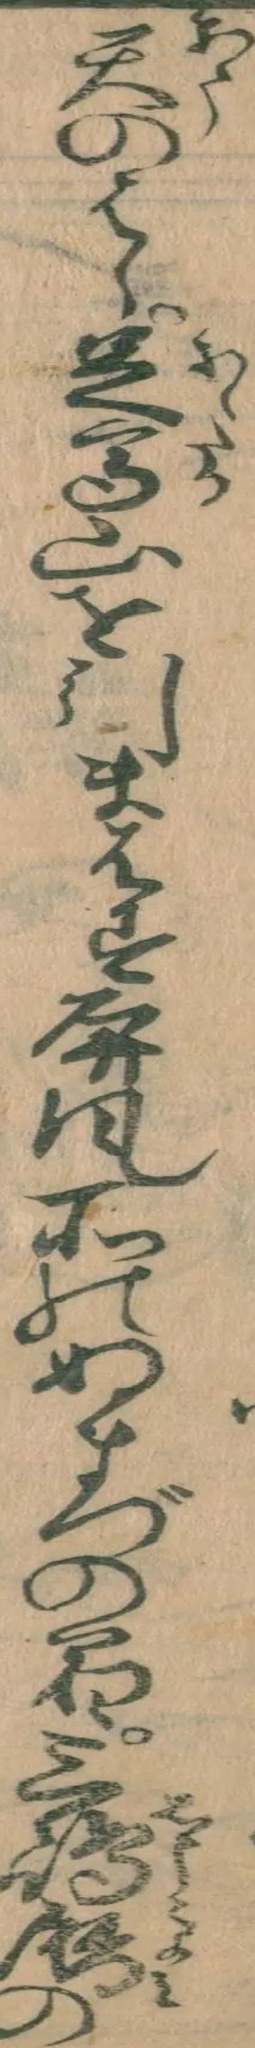天のはし。足高山を引まはす屏風所のぬまづの宿。三島暦の
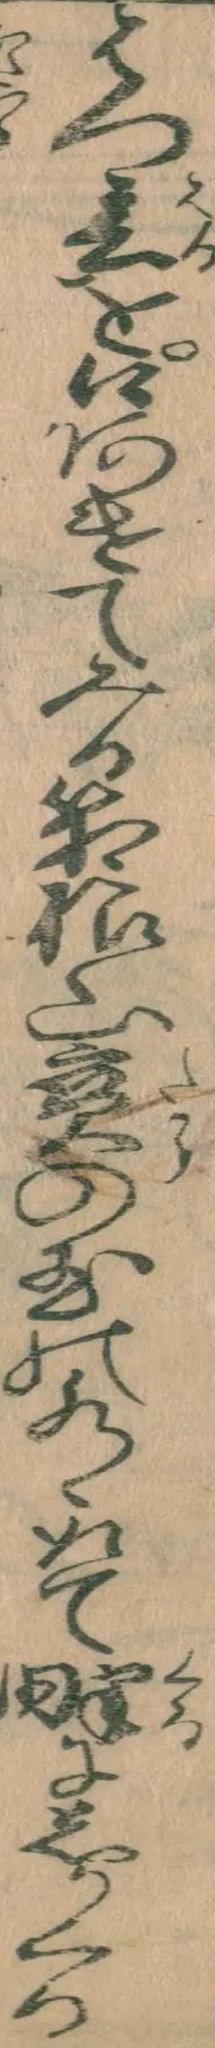はつ春を。口あけてみる箱根山宝の玉の水取て畔にしかくる
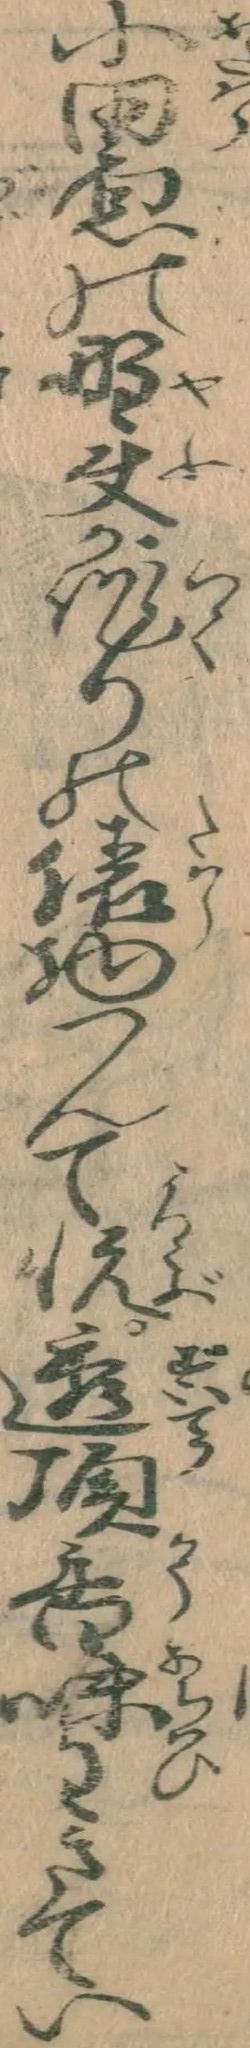小田原の野夫が作りの俵物つんて悦。透頂香味わきてい
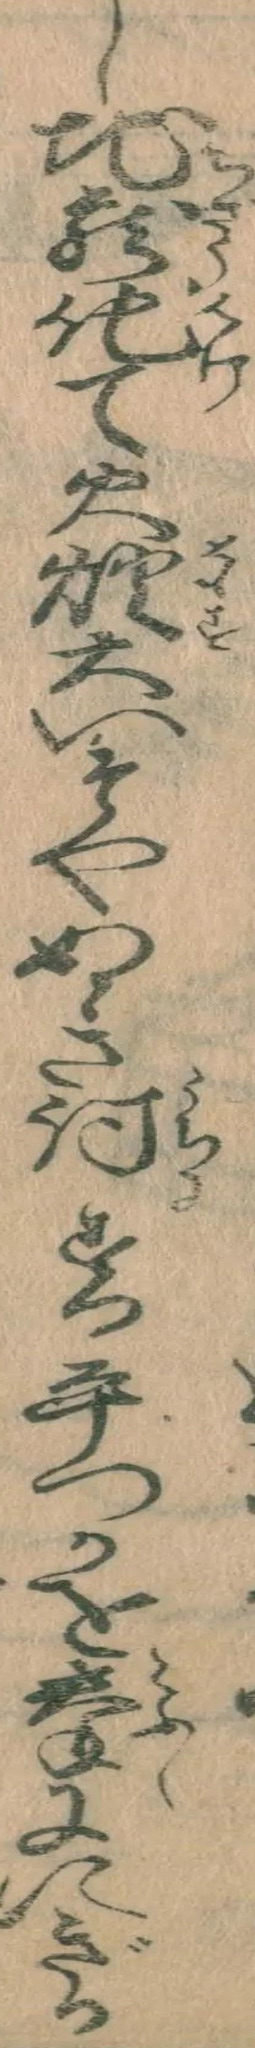し地蔵化て火灯大いそやぬき討する平つかを拳ににぎる
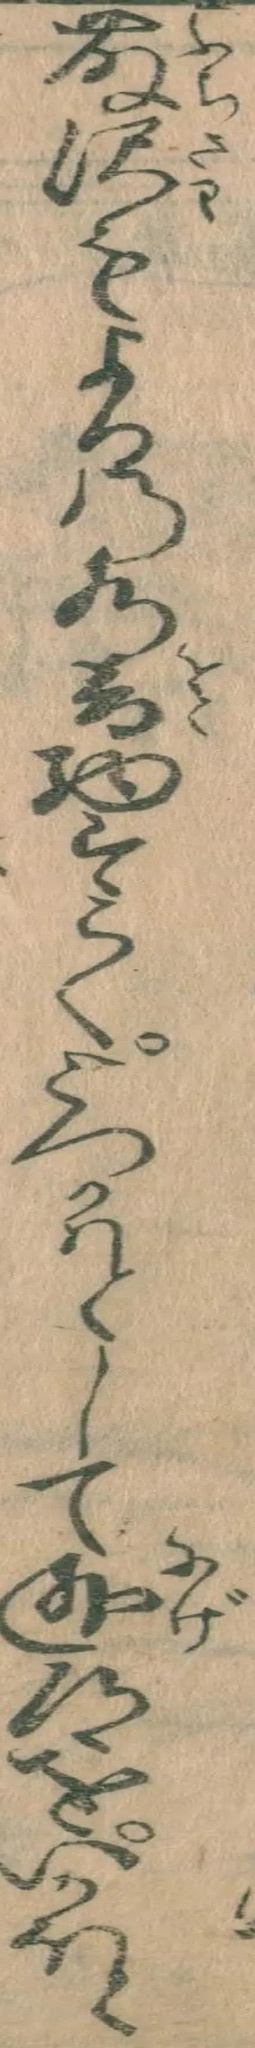藤沢もよるの水音物すこく。とつかはとして逃道を。いかほと
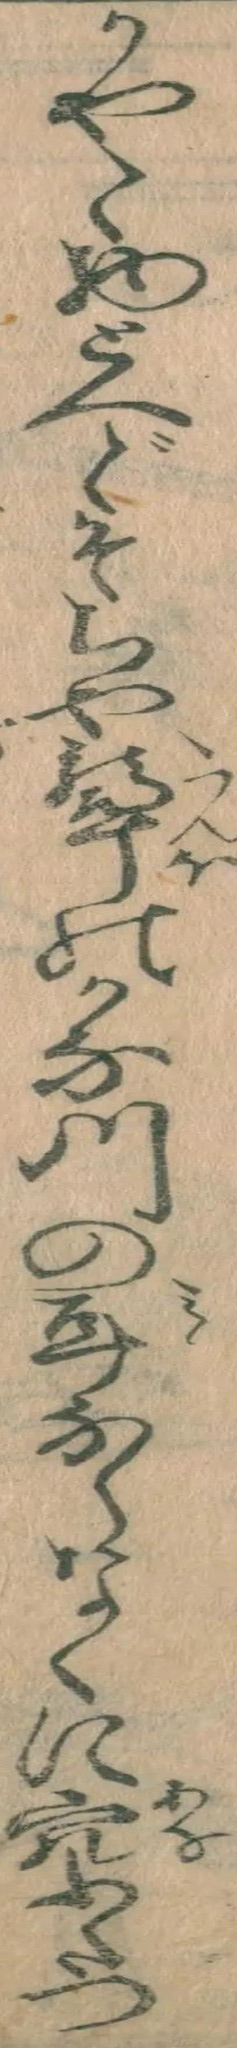かやと物とへどそちや聾のかな川の耳ならなくに穴ふたつ
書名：新竹斎 5巻
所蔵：国立国会図書館 National Diet Library, JAPAN
